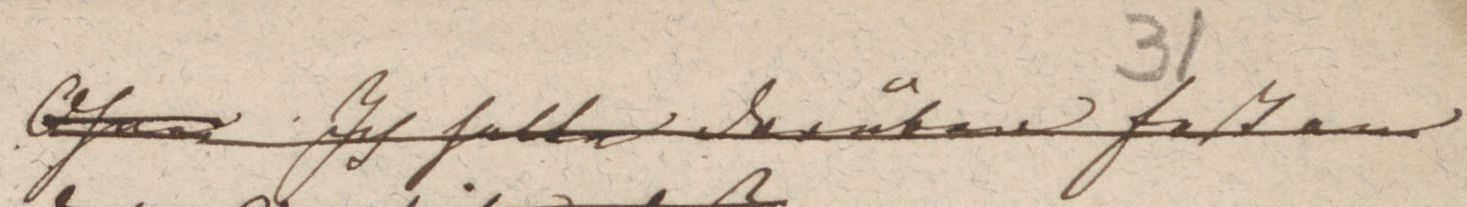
Ohne Ich hatte darüber fest an
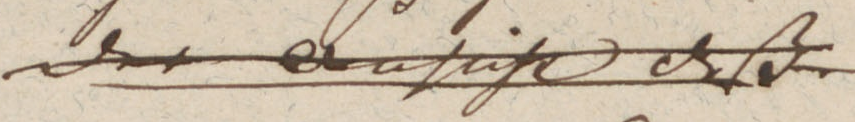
der Ansicht dass
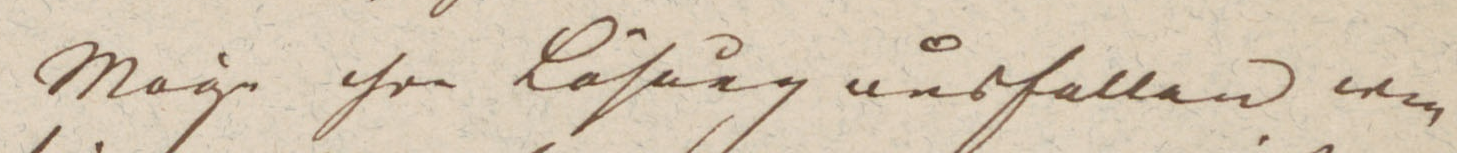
Möge ihre Lösung ausfallen wie
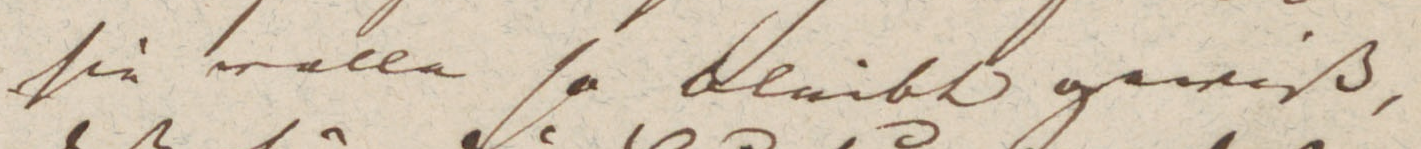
sie wolle so bleibt gewiss,
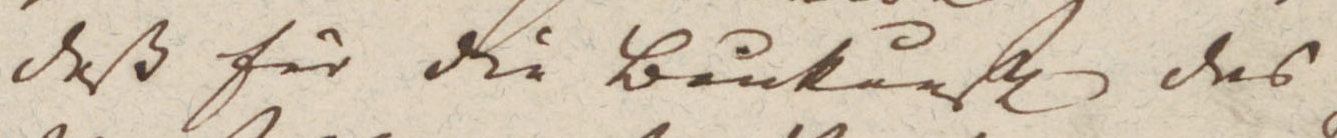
dass für die Baukunst das
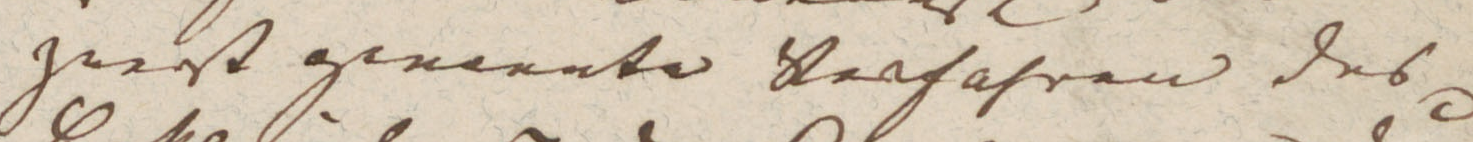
zuerst genannte Verfahren des
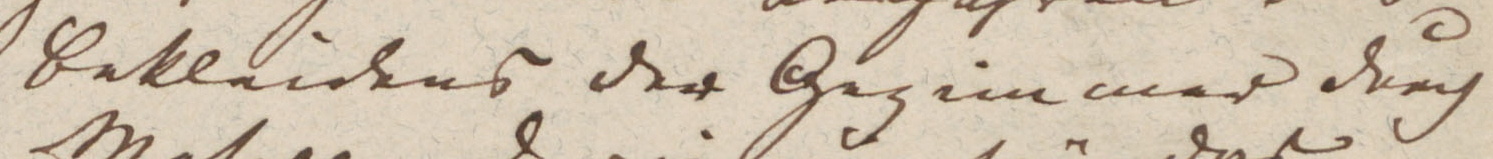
Bekleidens der gGezimmer durch
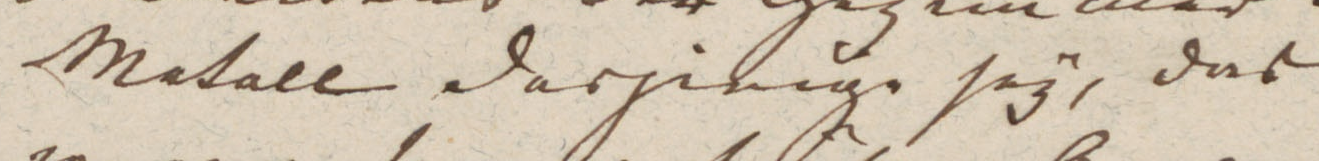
Metall dasjenige sey, das
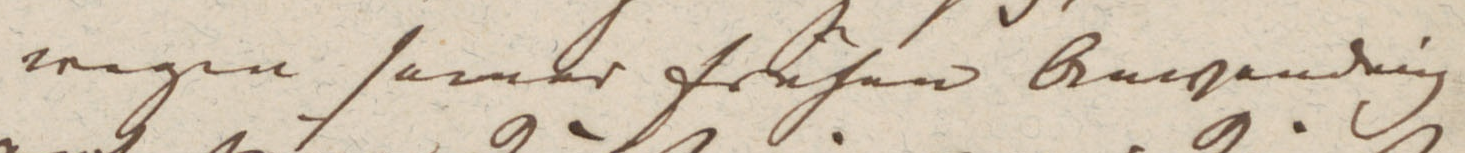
wegen seiner frühen Anwendung
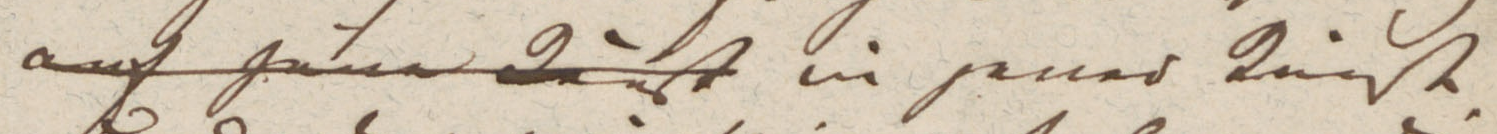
auf jene Kunst in jener Kunst
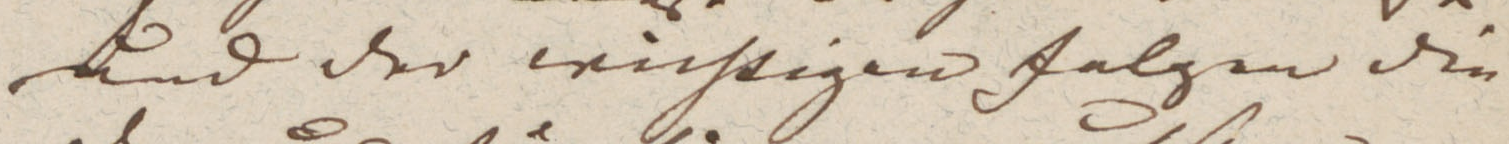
und der wichtigen Folgen die
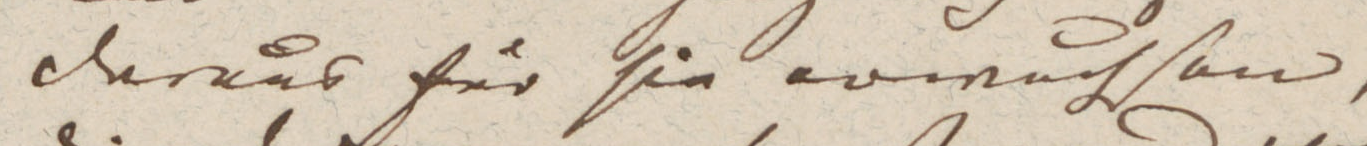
daraus für sie erwuchsen,
